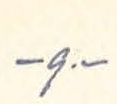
9.
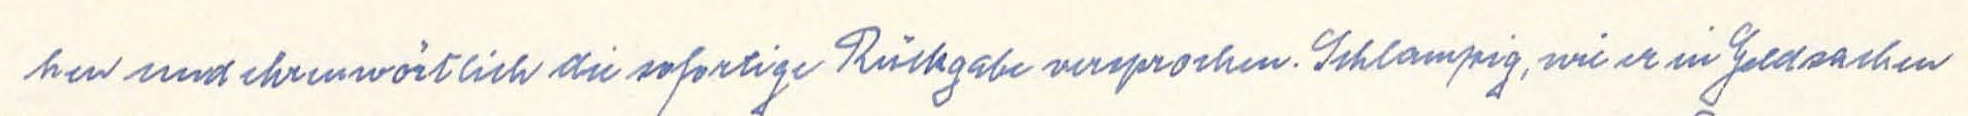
hen und ehrenwörtlich die sofortige Rückgabe versprochen. Schlampig, wie er in Geldsachen
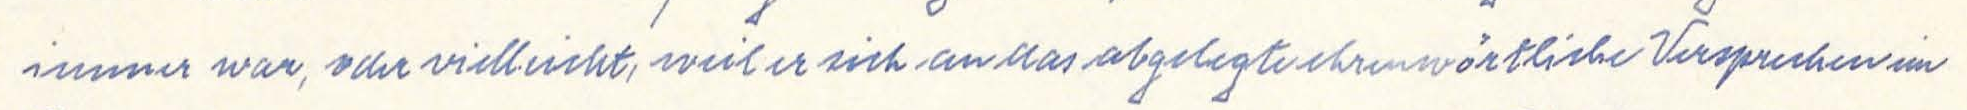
immer war, oder vielleicht, weil er sich an das abgelegte ehrenwörtliche Versprechen im
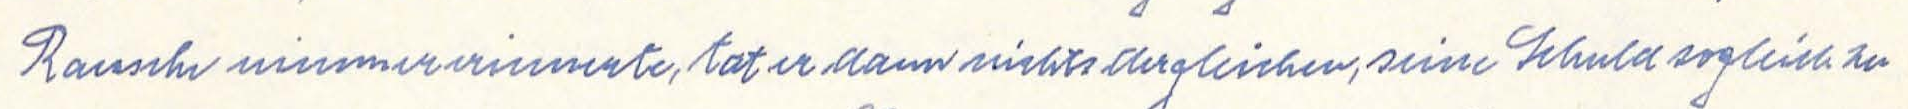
Rausch nimmer erinnerte, tat er dann nichts dergleichen, sein Schuld sogleich zu
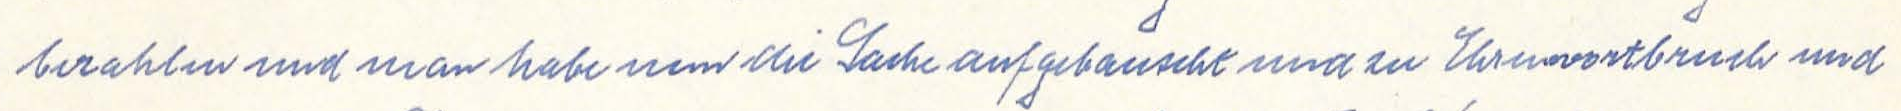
bezahlen und man habe nun die Sache aufgebauscht und zu Ehrenwortbruch und
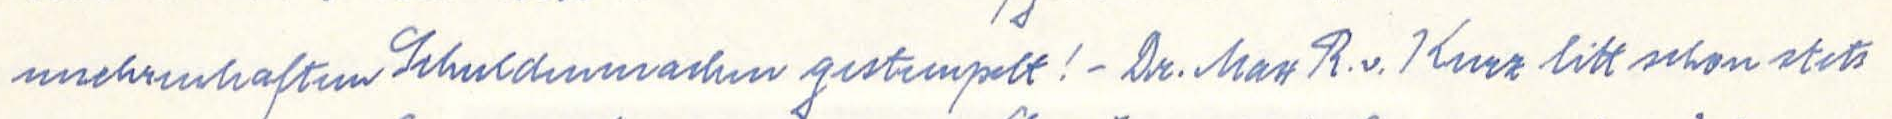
unehrenhaftem Schuldenmachen gestempelt. - Dr. Max R. von Kurz litt schon stets
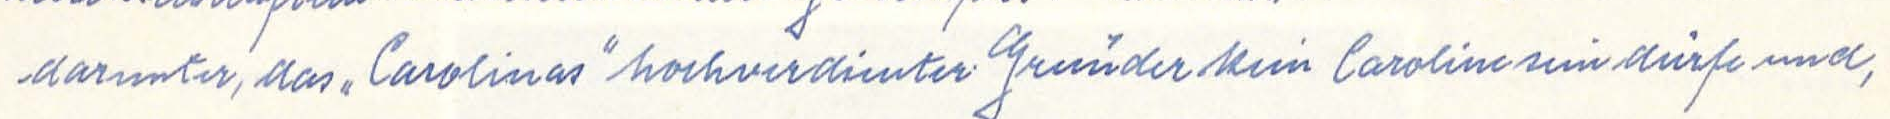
darunter, das "Carolinas" hochverdienter Gründer kein Caroline sein dürfe und,
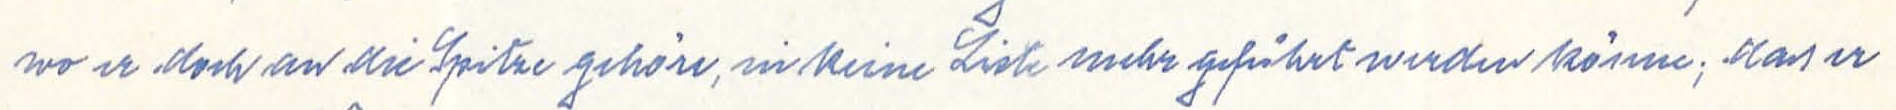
wo er doch an die Spitze gehöre, in keine Liste mehr geführt werden känne, das er
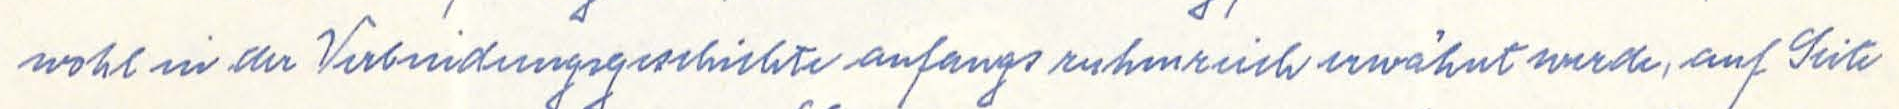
wohl in der Verbindungsgeschichte anfangs ruhmreich erwähnt wurde, auf Seite
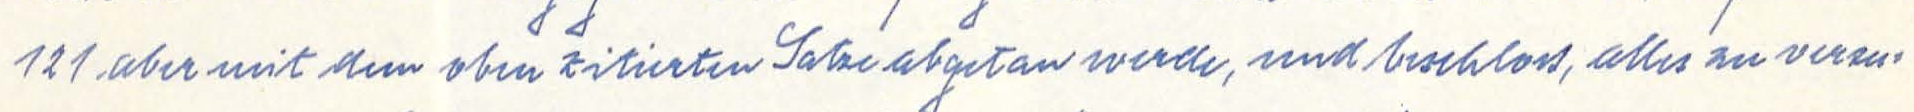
121. aber mit dem oben zitierten Satze abgetan werde, und beschloss, alles zu versu-
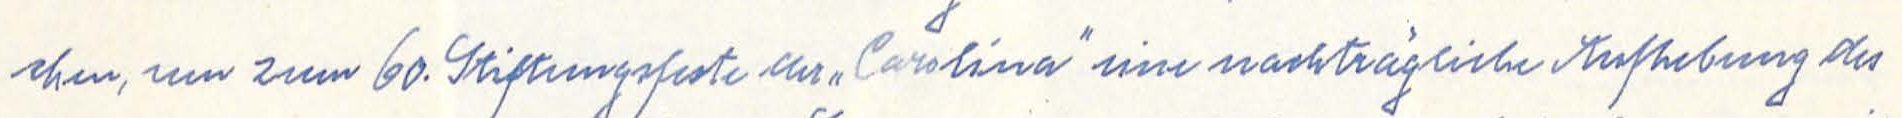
chen, um zum 60. Stiftungsfeste der "Carolina" eine nachträgliche Aufhebung des
